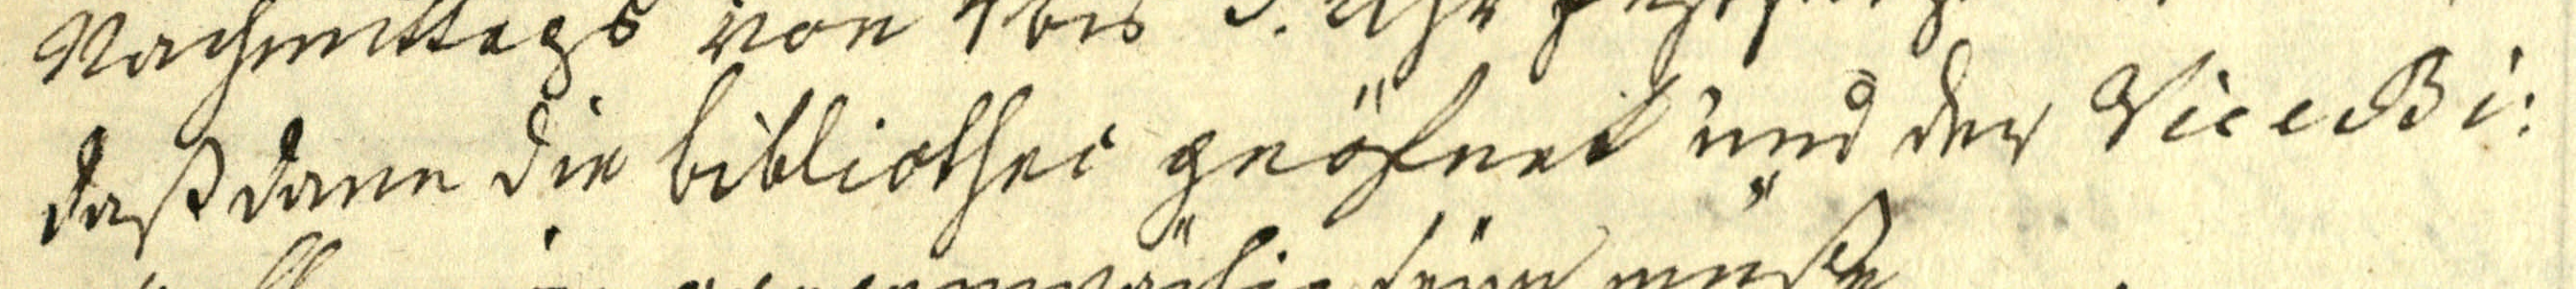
daß dann in Bibliothec geöfnet und der Vice Bi¬
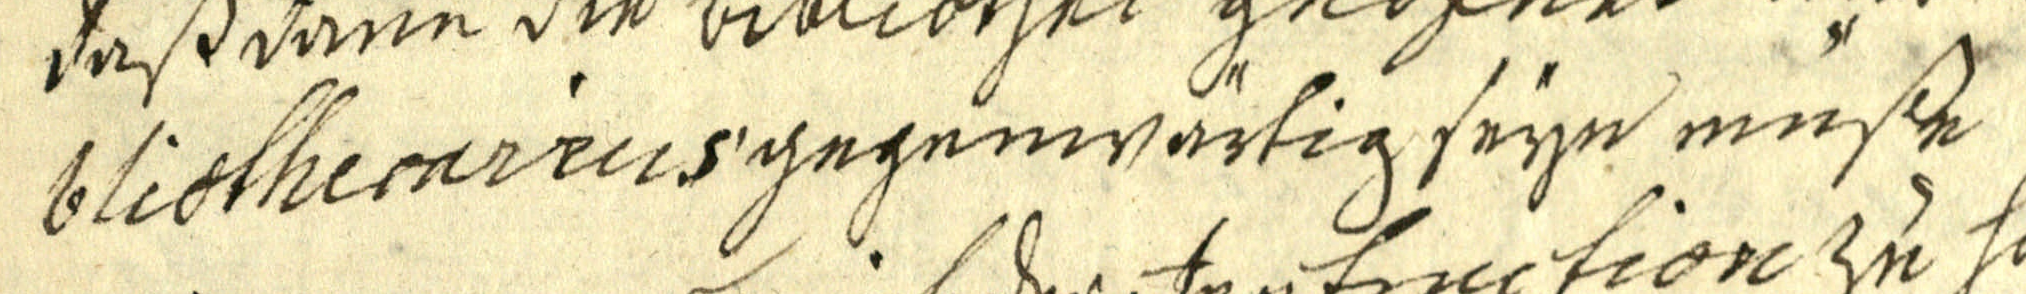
bliothecarius gegenwärtig seÿn müße
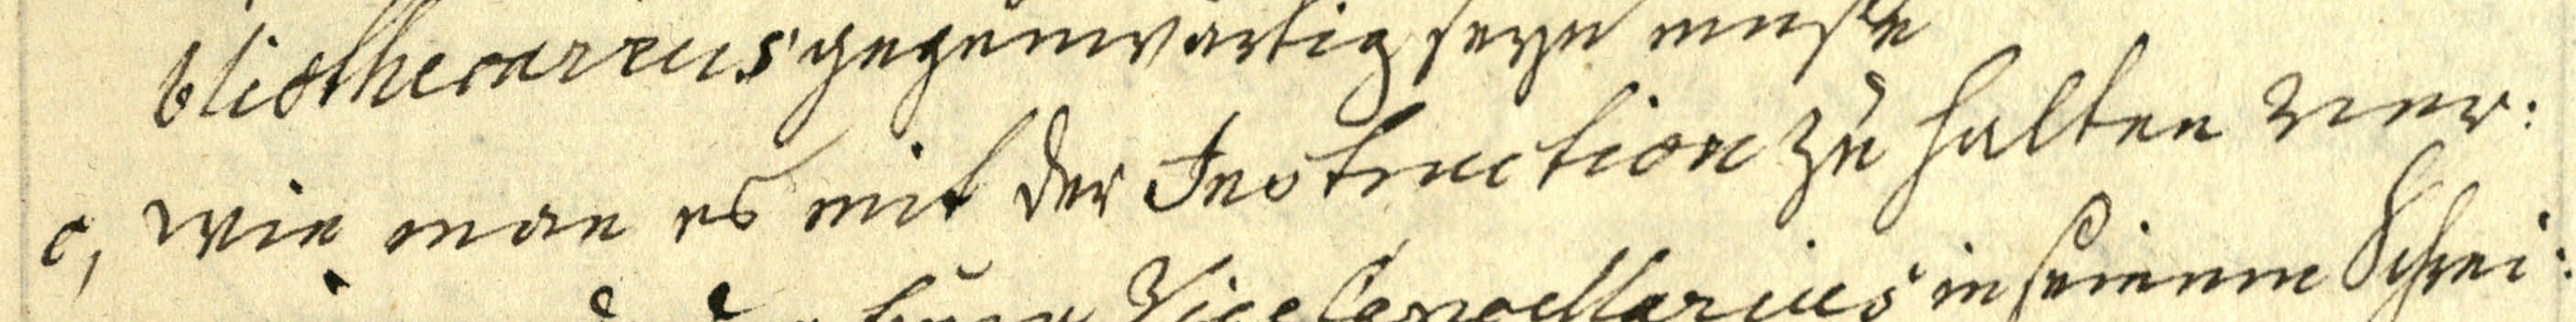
c, wie man es mit der Instruction zu halten ver¬
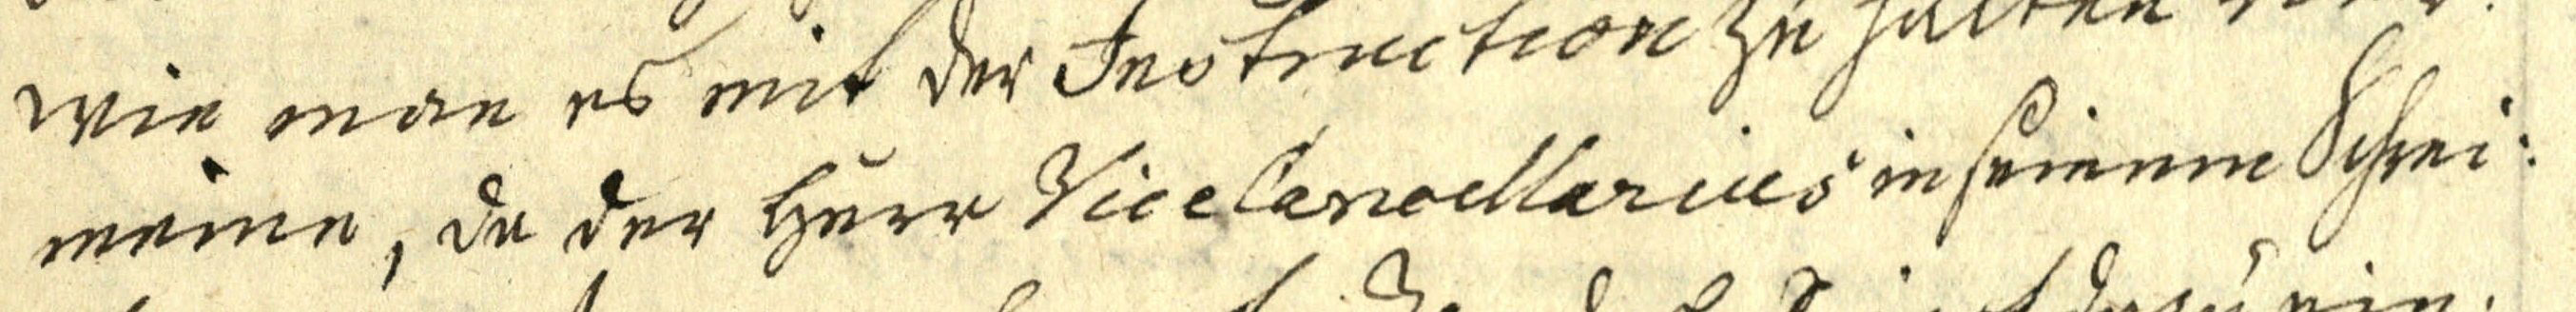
meine, da der Herr ViceCancellarius in seinem Schrei¬
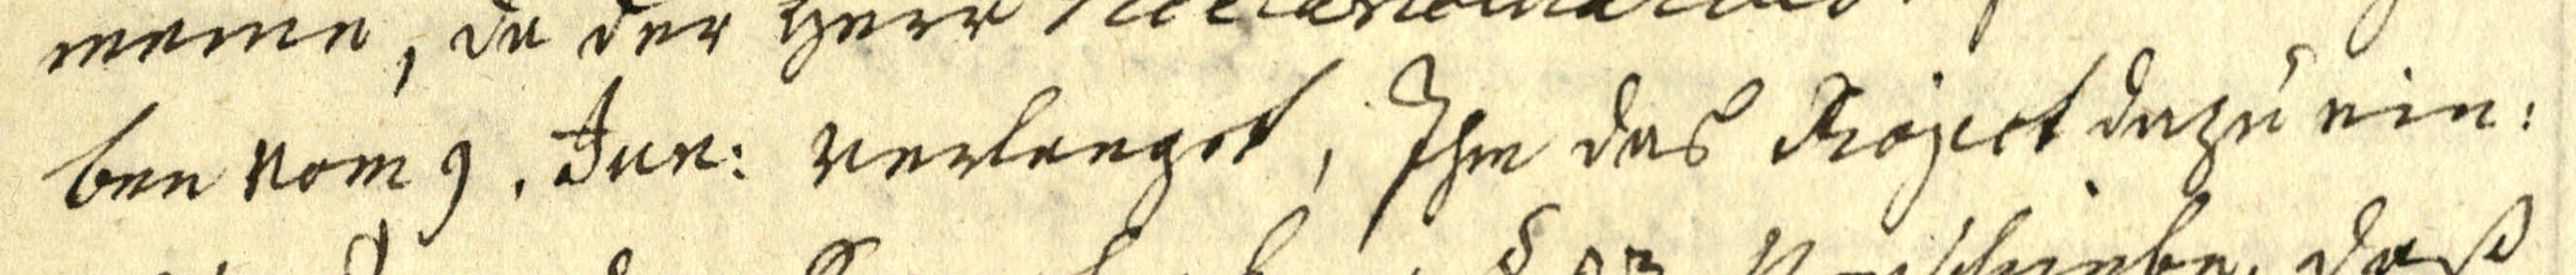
ben vom 9. Jun. verlanget, Ihm das Project dazu ein¬
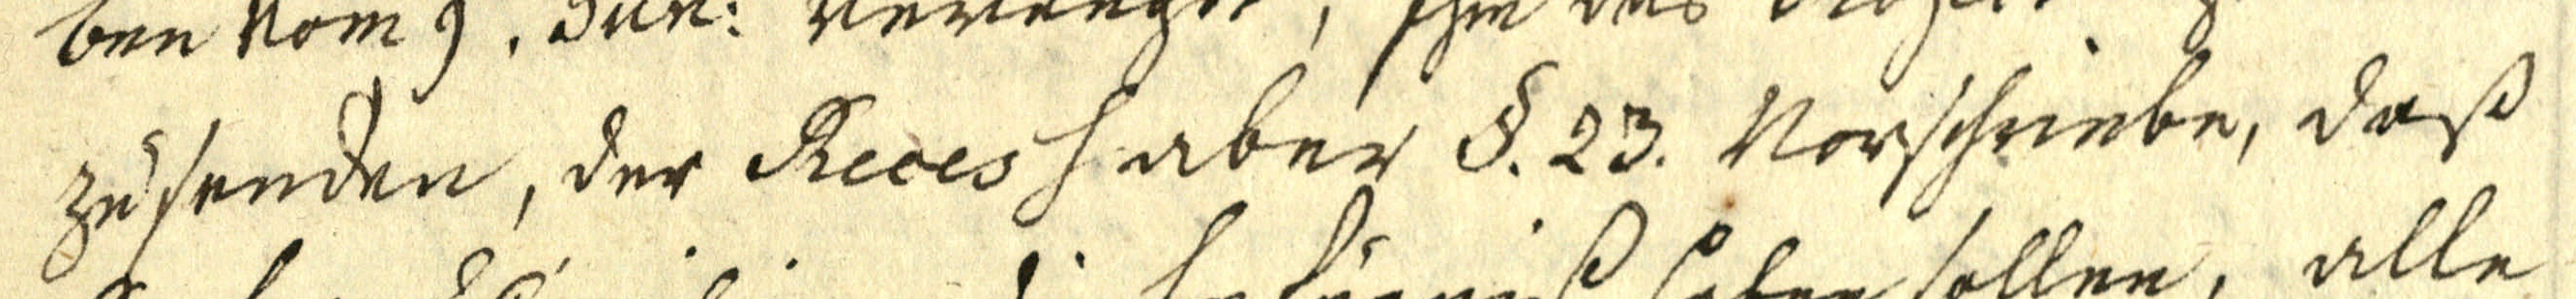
zusenden, der Recess aber §. 23 vorschriebe, daß
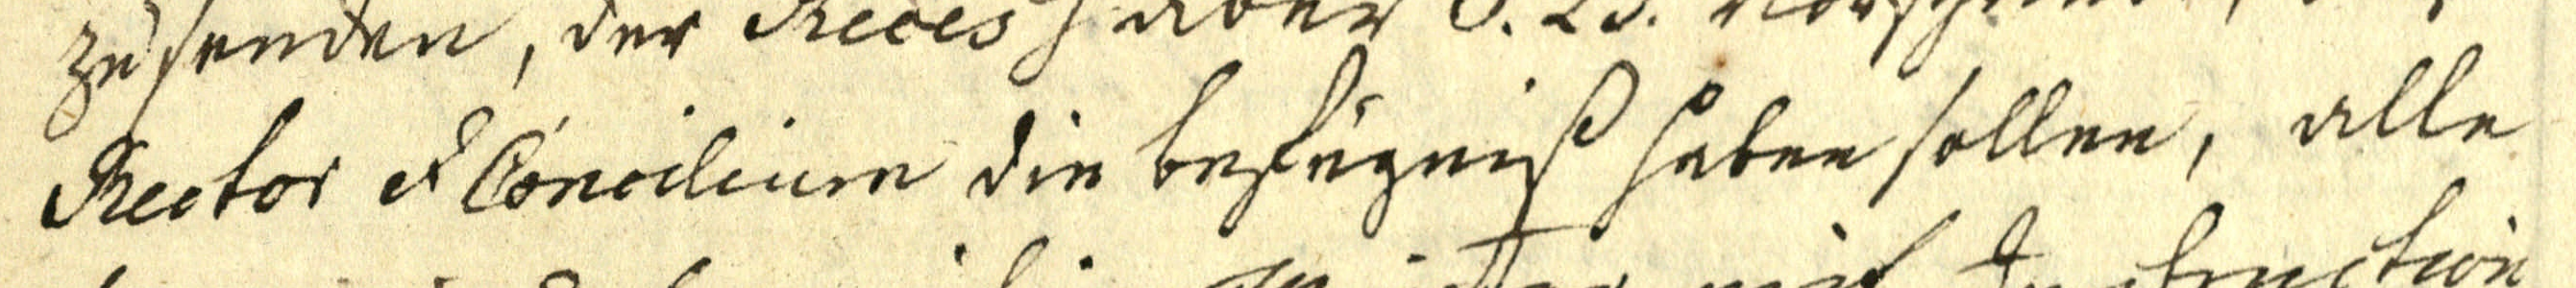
Rector et Concilium die Befugniß haben sollen, alle
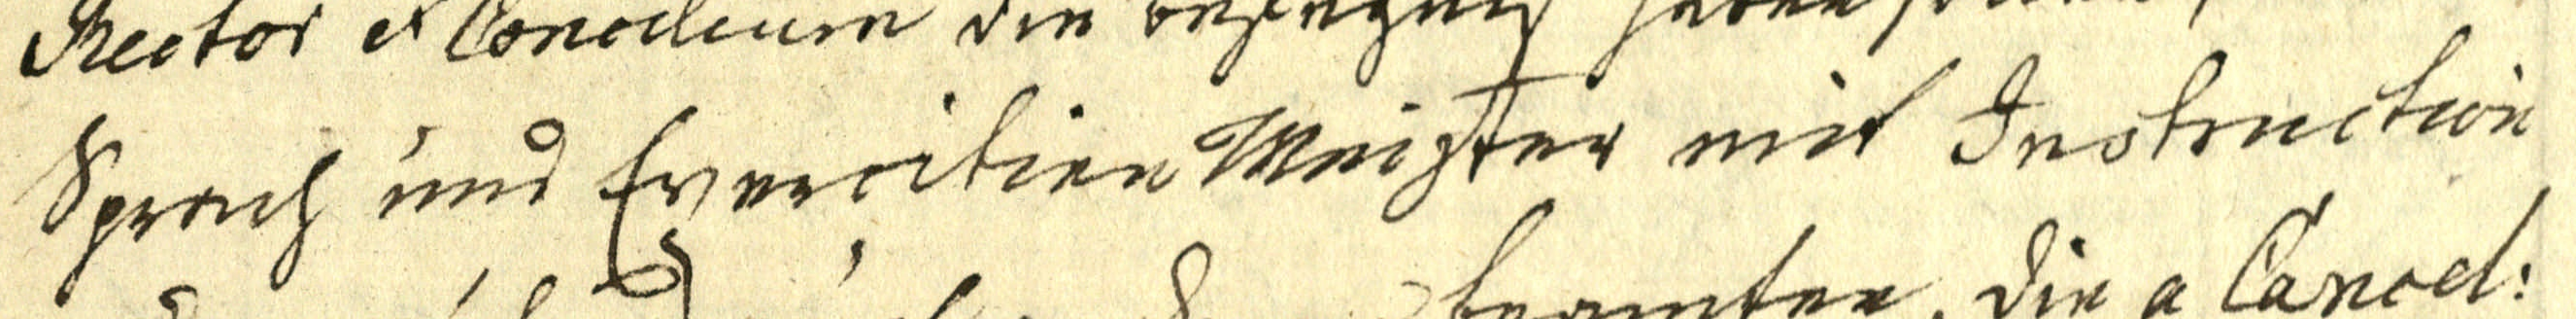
Sprach und Exercitien Meister mit Instruction
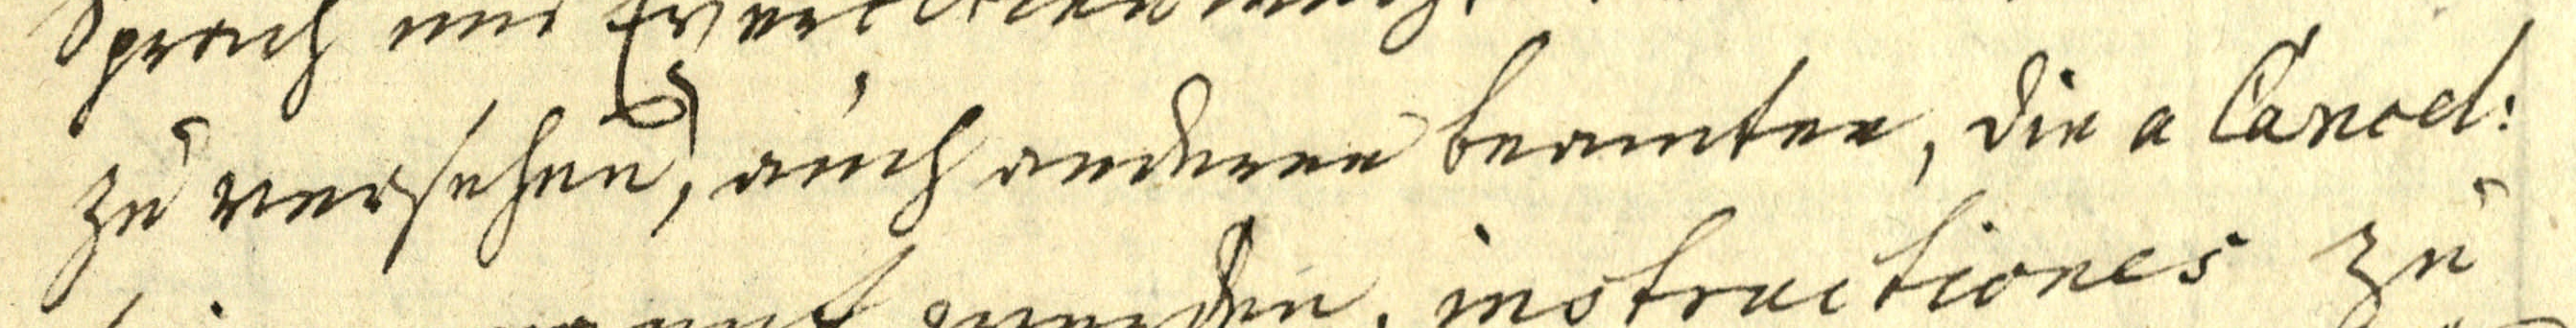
zu versehen, auch anderen Beamten, die a Cancel¬
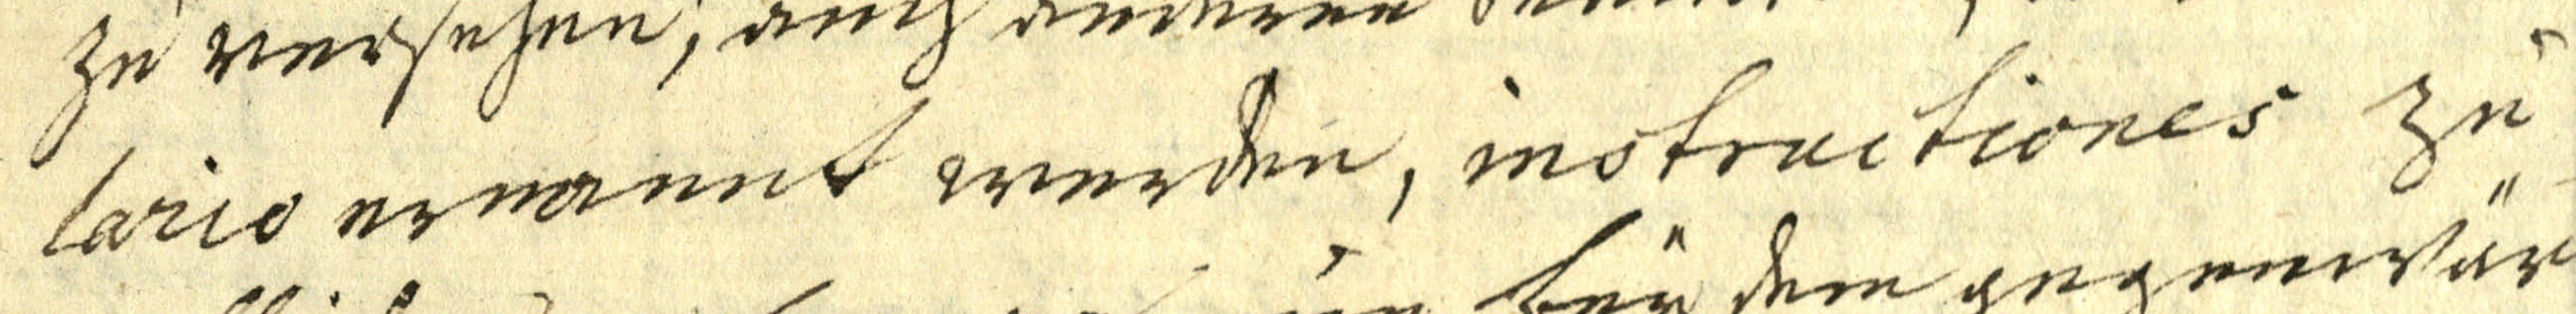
lario ernannt werden, instructiones zu
